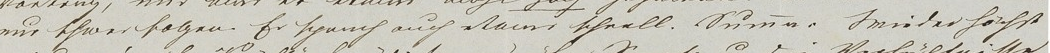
nur schwer folgen. Er sprach auch etwas schnell. Summa: Wieder höchst
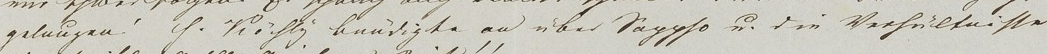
gelungen! H. Köchly kündigte an über Sappho u. die Verhältnisse
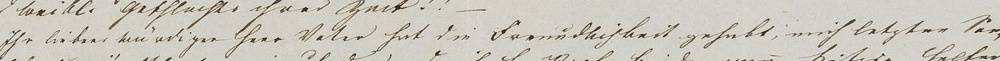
Ihr liebens würdiger Herr Vater hat die Freundlichkeit gehabt, mich letzten Sonn-
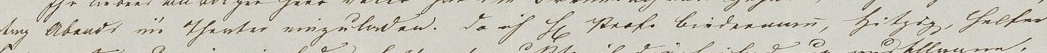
tag Abends in's Theater einzuladen. Da ich Herrn Prof Biedermann, Hitzig, Helfer
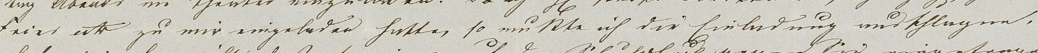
Fries etc zu mir eingeladen hatte, so mußte ich die Einladung ausschlagen,
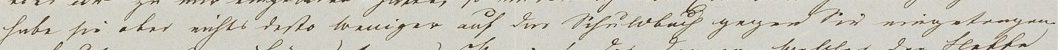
habe sie aber nichts desto weniger auf das Schuldbuch gegen Sie eingetragen.
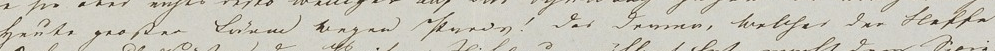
Heute großer Lärm wegen Paris! Das Drama, welches der Neffe
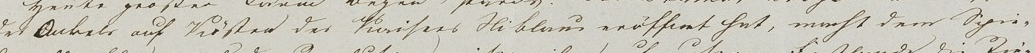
des Onkels auf Kösten des Kaisers Niklaus eröffnet hat, macht dem Spie-
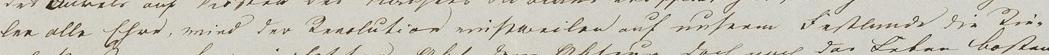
ler alle Ehre, wird der Revolution einstweilen auf unserm Festlande die Rie-
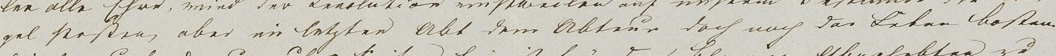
gel stoßen, aber im letzten Akt dem Akteur doch noch das Leben kosten.
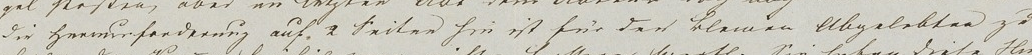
Die Herausforderung auf 2 Seiten hin ist für den kleinen Abgelebten zu
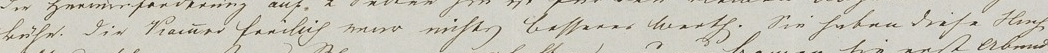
kühn. Die Kammer freilich war nichts besseres werth. Sie haben diese Nach-
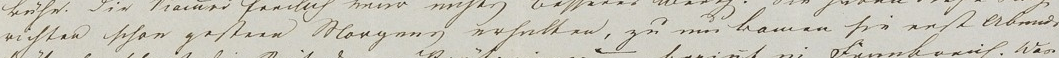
richten schon gestern Morgens erhalten, zu uns kamen sie erst Abends
